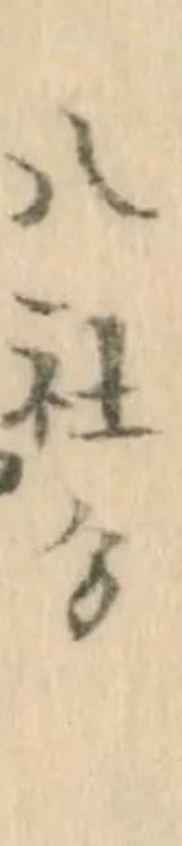八社分
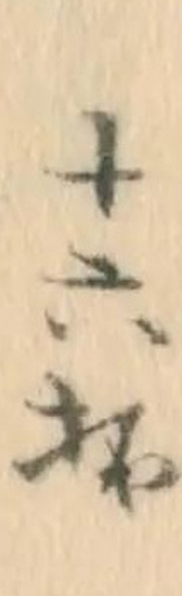十六杯
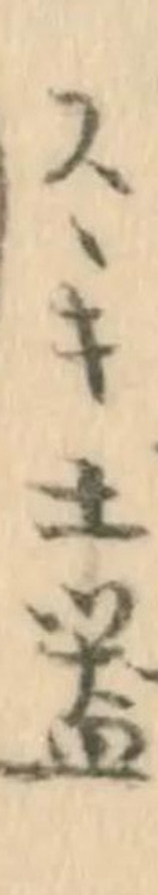スヽキ土器
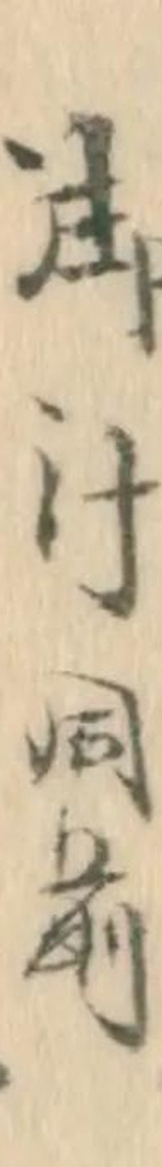御汁同前
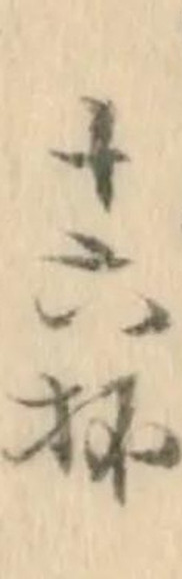十六杯
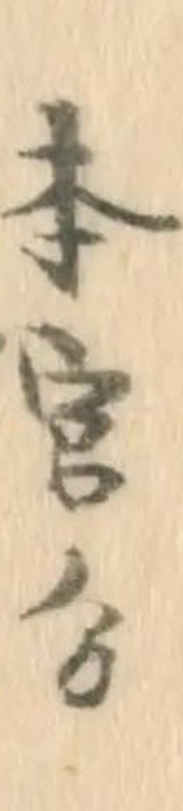本宮分
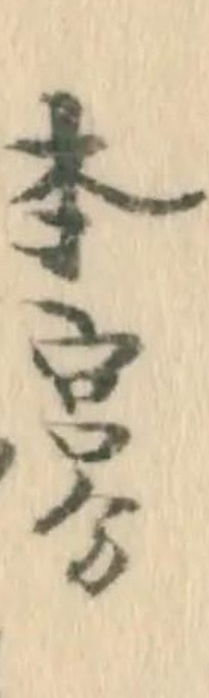本宮分
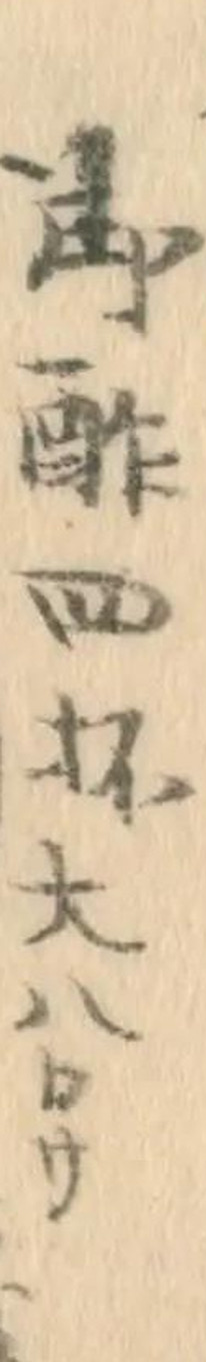御酢四杯大ハカサ土器
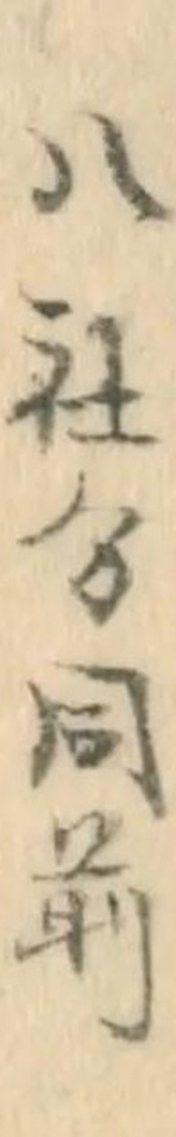八社分同前
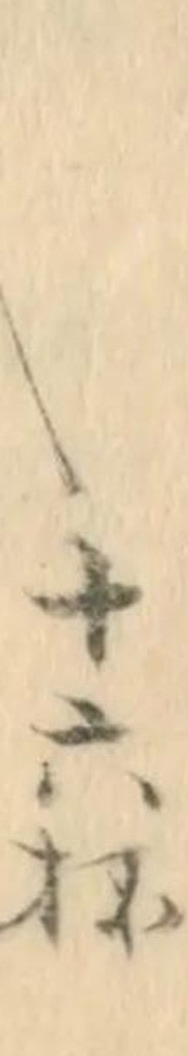十六杯
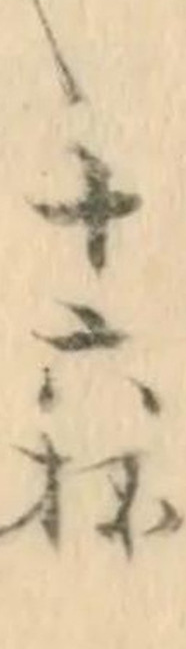十六杯
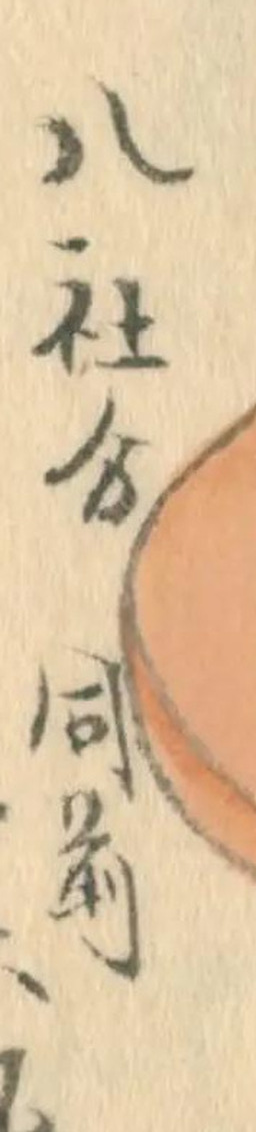八社分同前
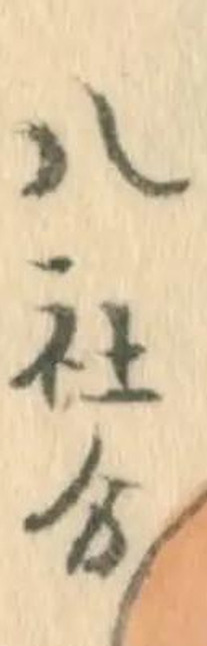八社分
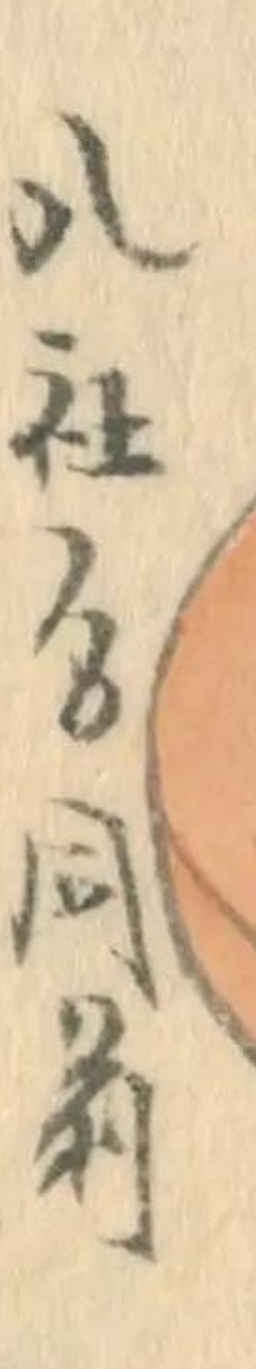八社分同前
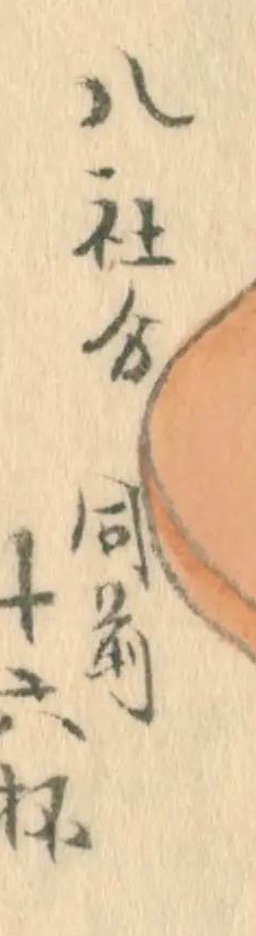八社分同前
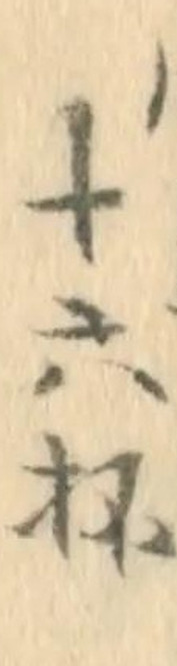十六杯
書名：葵御祭供進之神饌諸品色目書
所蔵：国立国会図書館 National Diet Library, JAPAN
